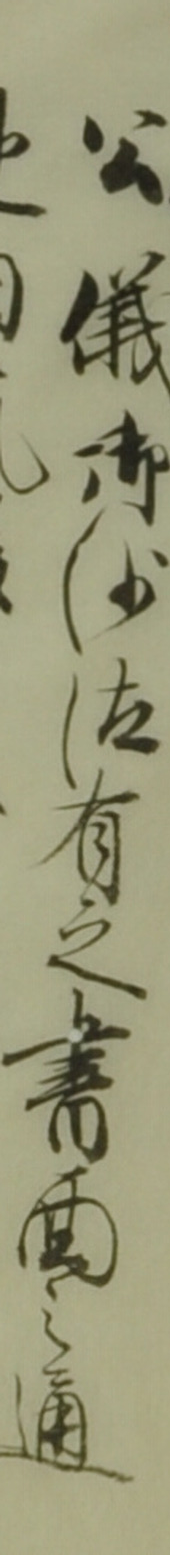公儀御沙汰有之之書面通

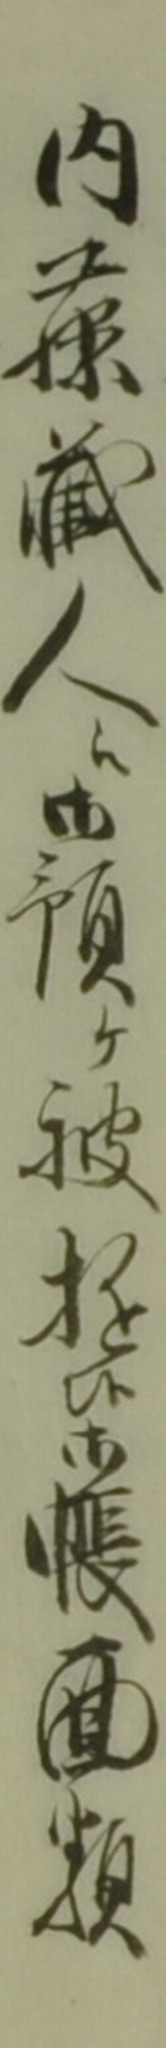内藤蔵人江御預ケ被遊候御帳面類同

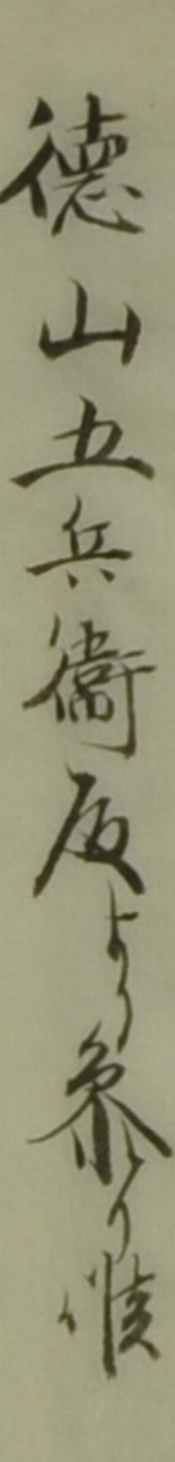一徳山五平衛殿より参り候
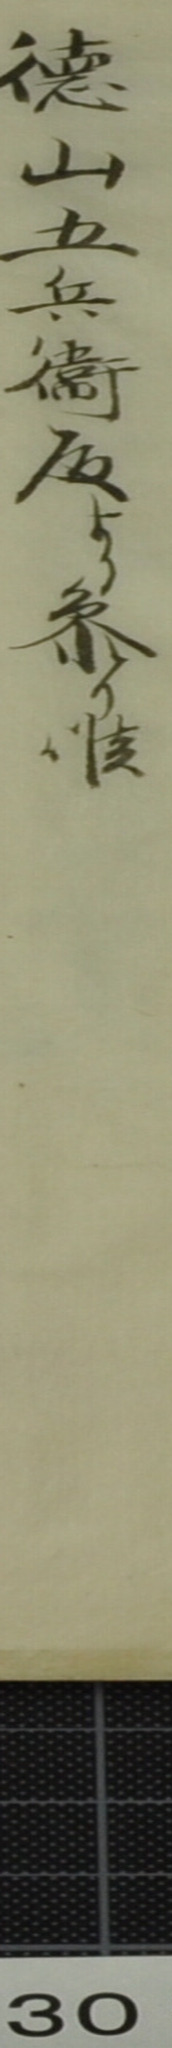一徳山五平衛殿より参り候
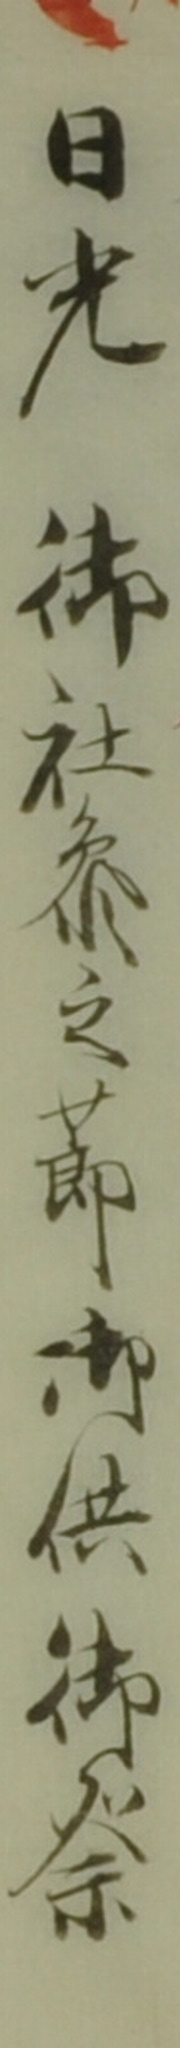日光御社参之節御供御祭
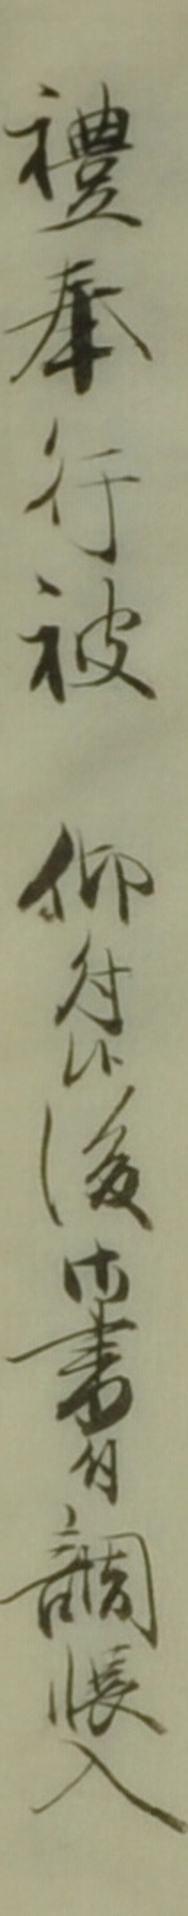禮奉行被仰付候後御書付調帳入一袋
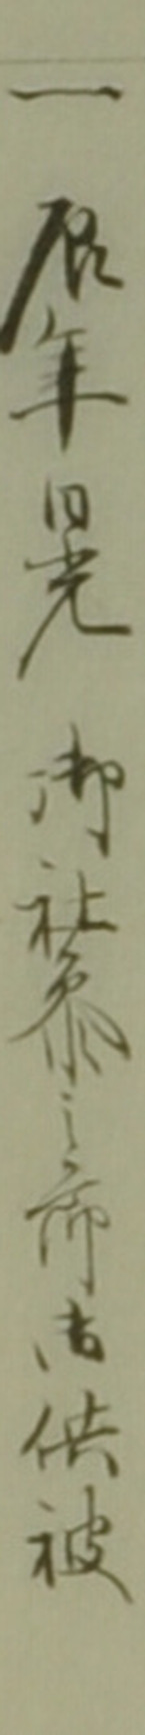一辰年日光御社参之節御供被
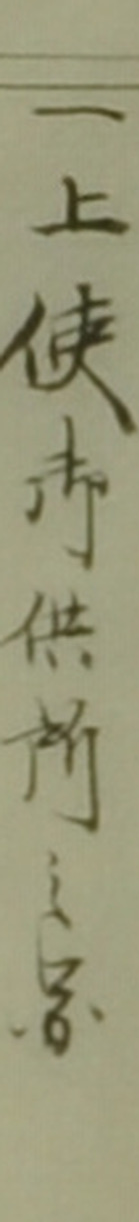一上使御供所之図同
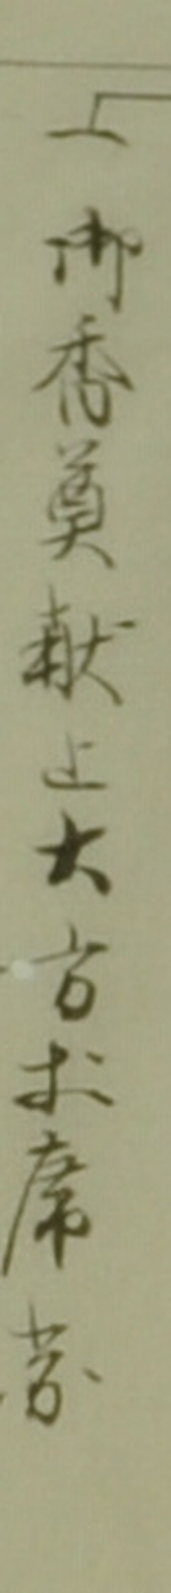一御香典献上大方等席図同
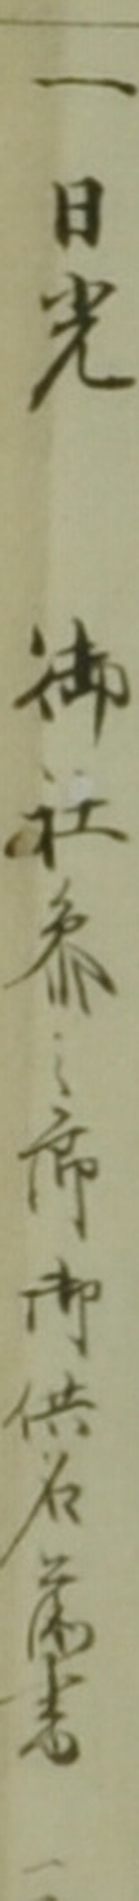一日光御社参之席御供名前書一冊

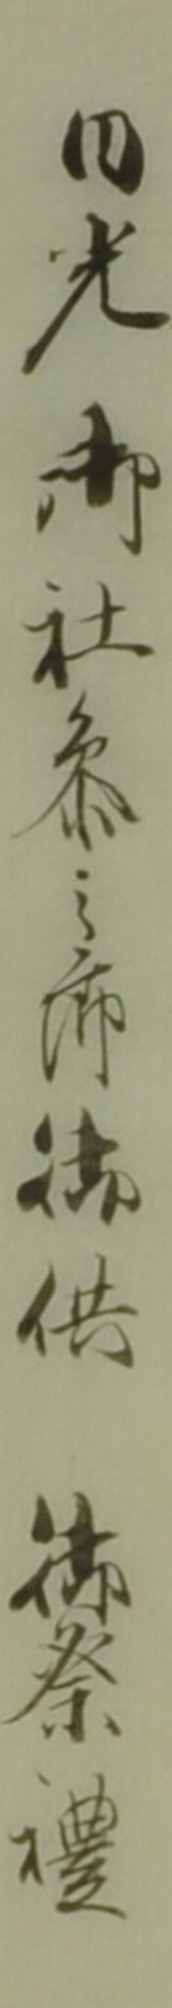日光御社参之節御供御祭禮
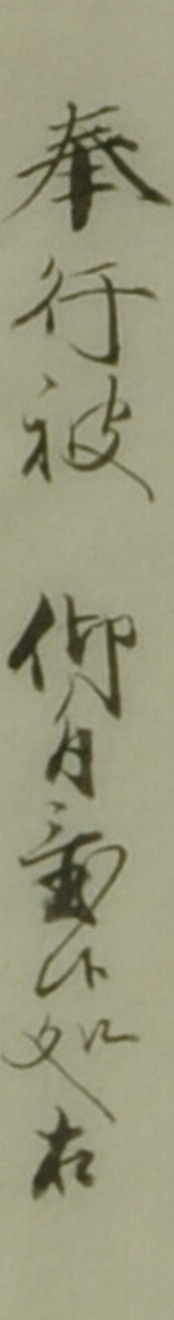奉行被仰付置候処右
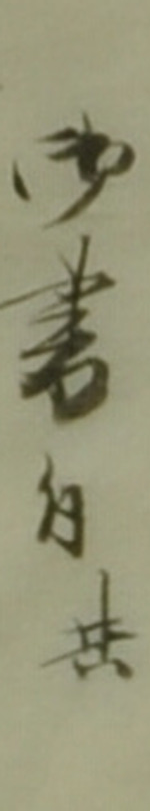御書付共
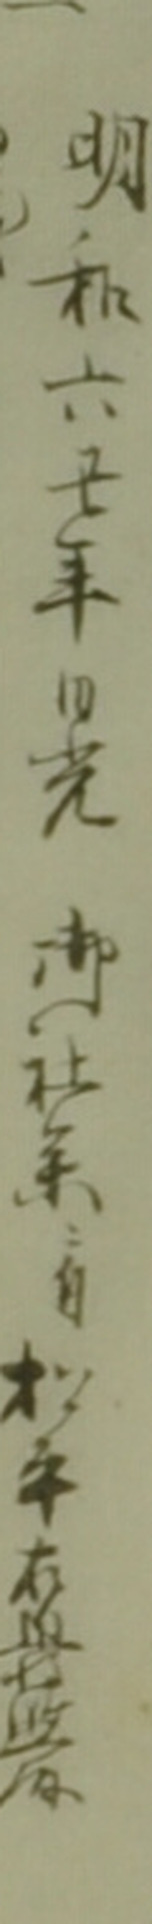一明和六丑年日光御社参ニ付松平右近殿
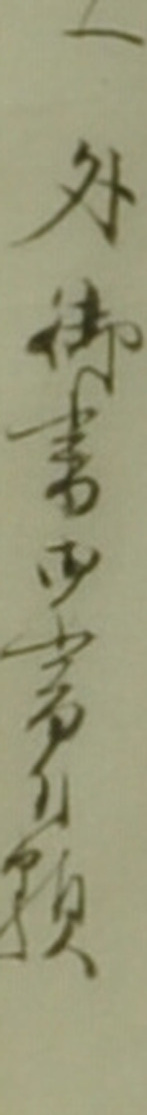一外御書御書付類

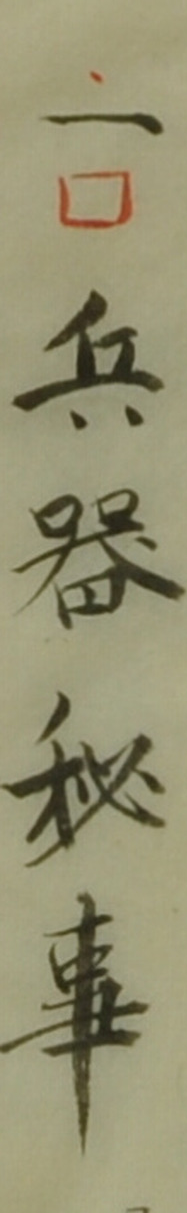一兵器一巻
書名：御直筆御書付類調帳
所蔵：伊那市立高遠町図書館・合同会社AMANE
